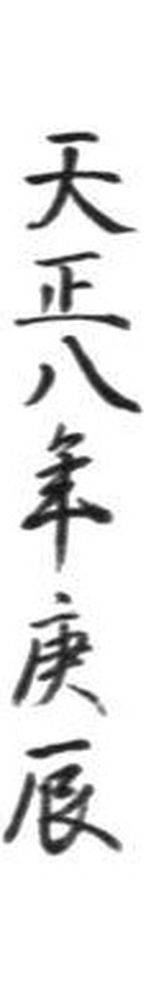天正八年庚辰
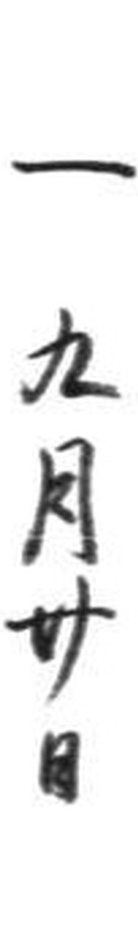一九月廿日
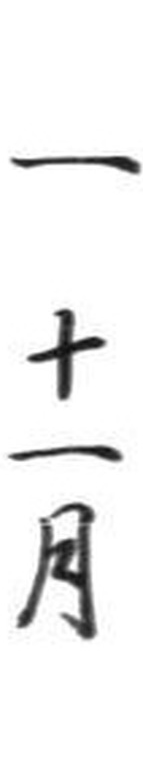一十一月

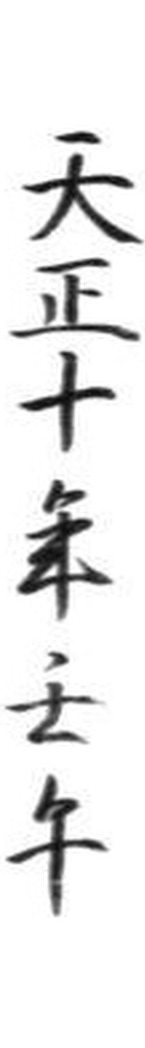天正十年壬午
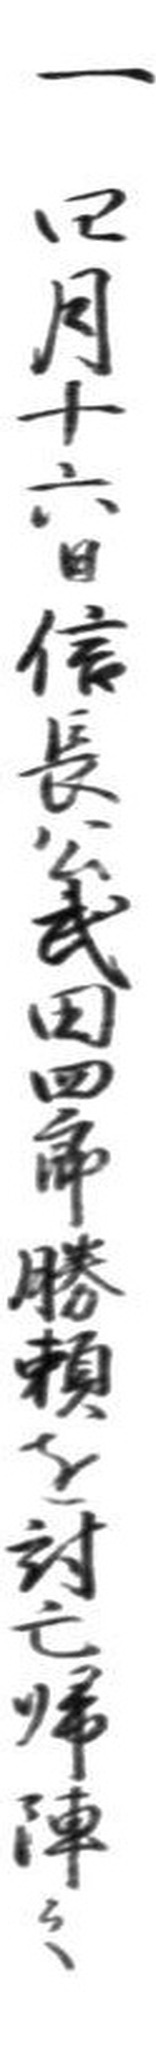一四月十六日信長公武田四郎勝頼を討亡帰陣之
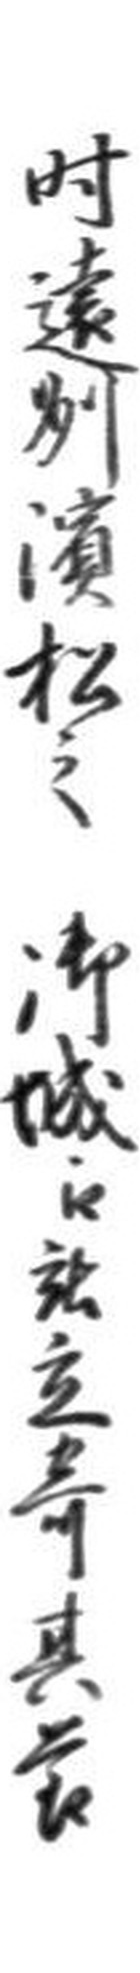時遠州浜松之御城江被立寄其節
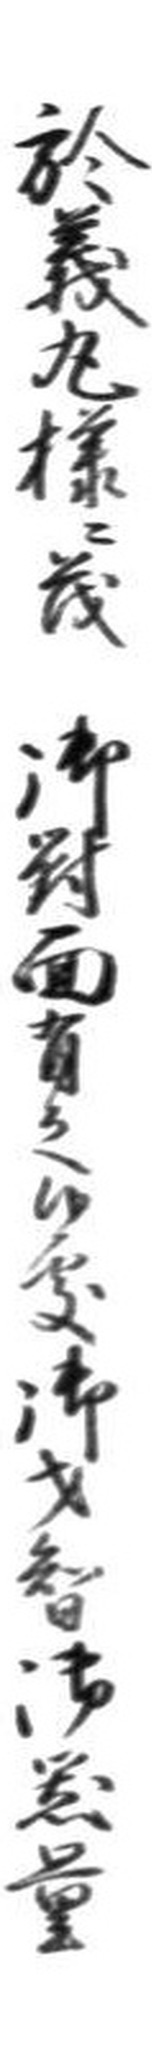於義丸様ニ茂御対面有之候処御才智御器量
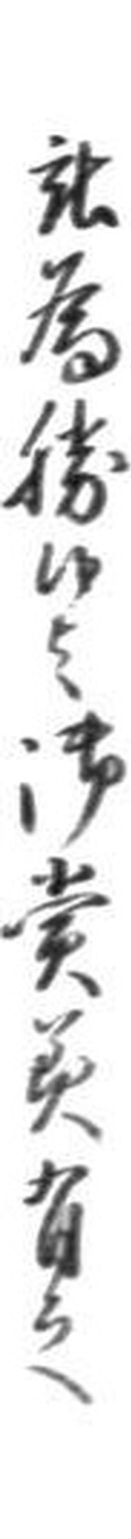被為勝候与御賞美有之

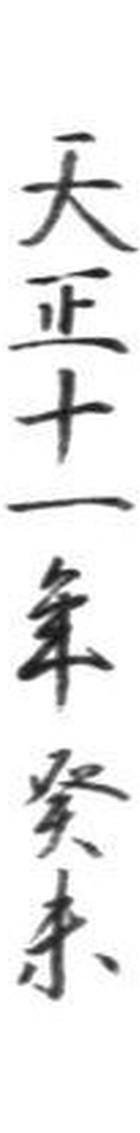天正十一年癸未
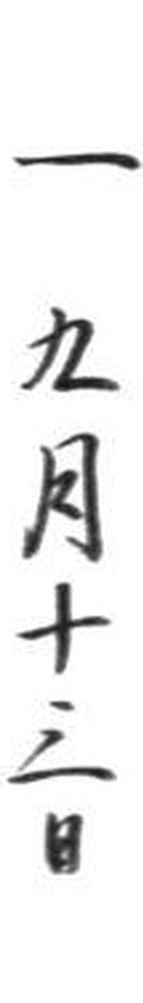一九月十三日

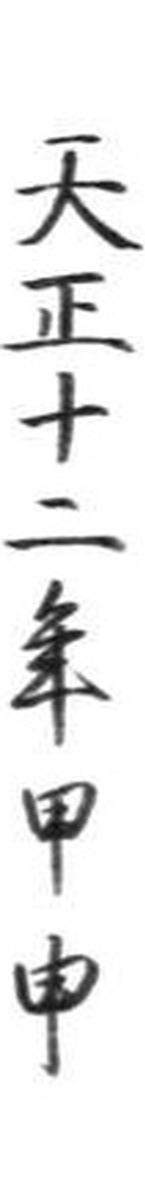天正十二年甲申
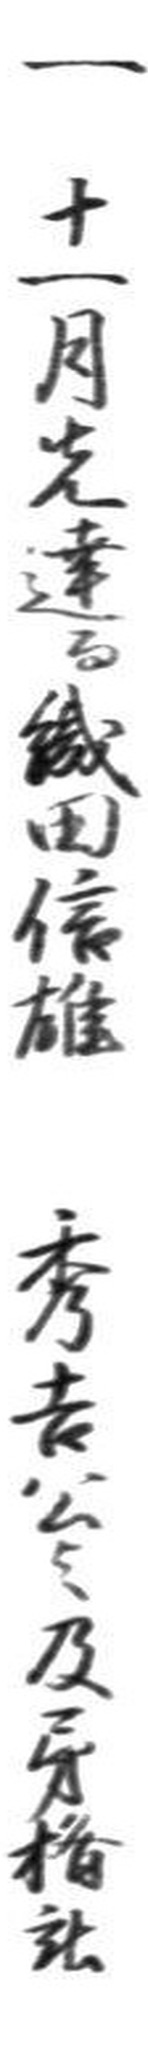一十一月先達而織田信雄秀吉公与及矛楯被
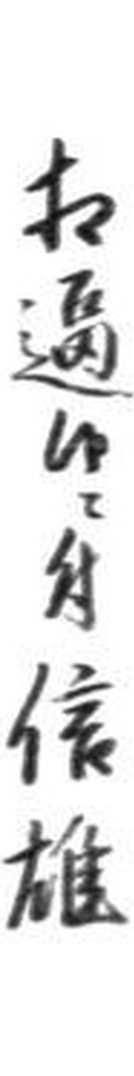相逼候ニ付信雄
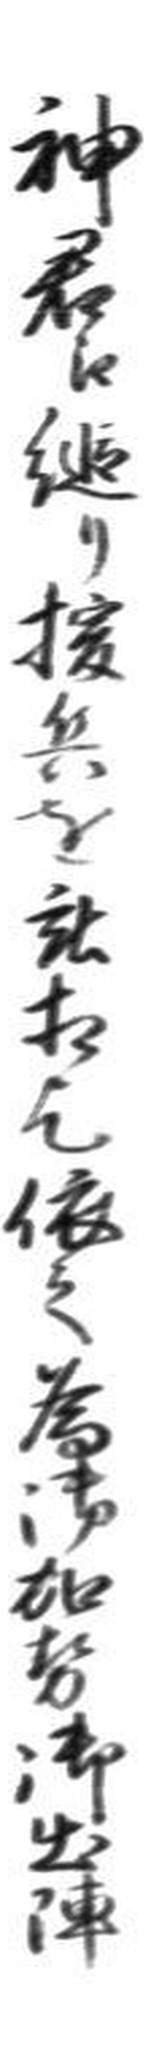神君江縋り援兵を被相乞依之為御加勢御出陣
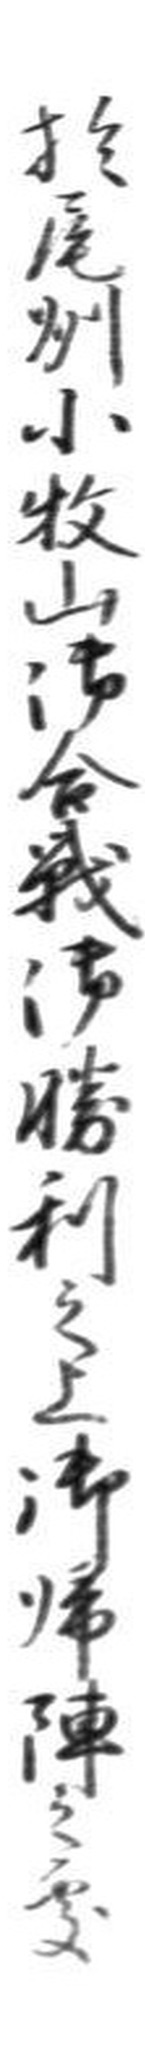於尾州小牧山御合戦御勝利之上御帰陣之処
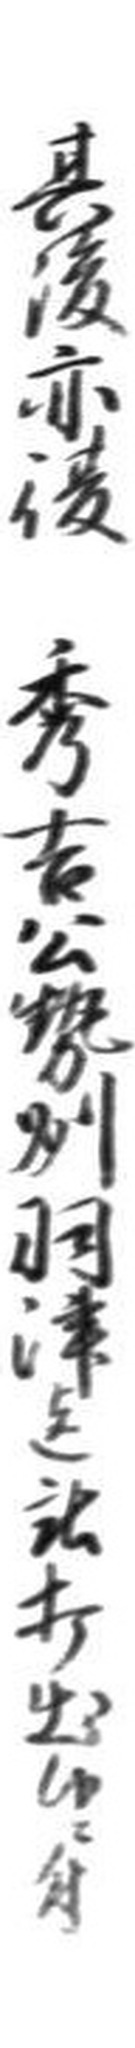其後亦復秀吉公勢州羽津迄被打出候ニ付
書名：家譜 一 秀康公 従天正二年到慶長十二年
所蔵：福井県文書館 Fukui Prefectural Archives
